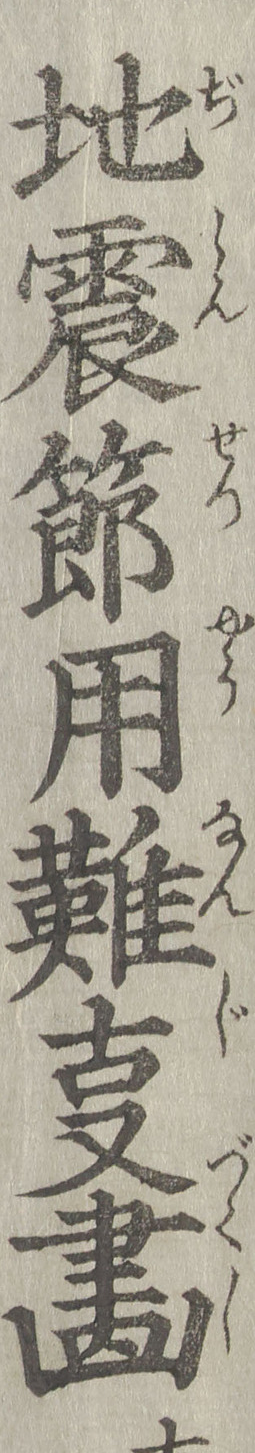地震節用難事尽

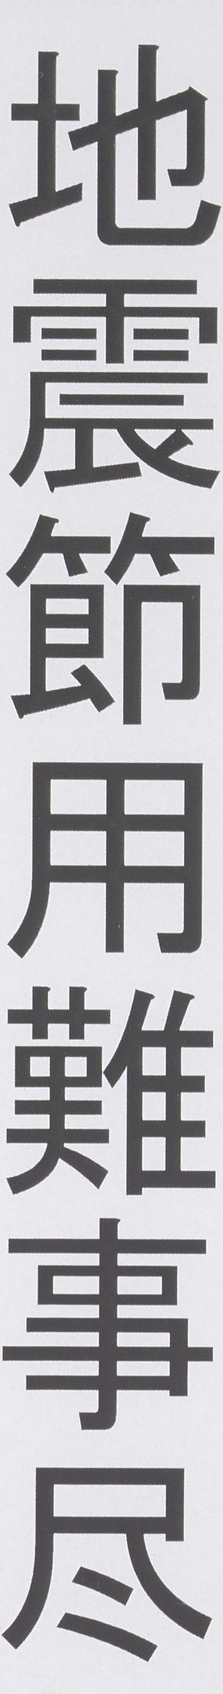地震節用難事尽
